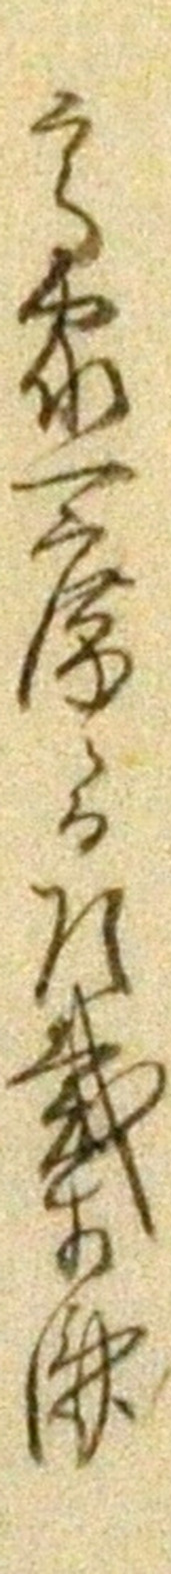高家一席ニ而頂戴相済
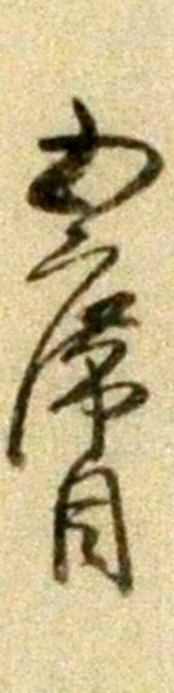五席目
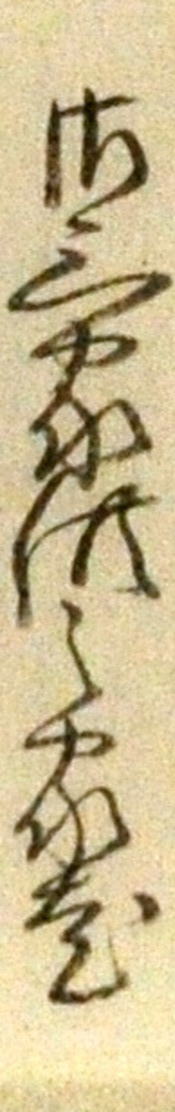御三家供之家老
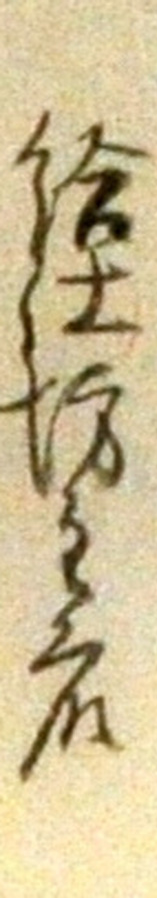給仕坊主衆
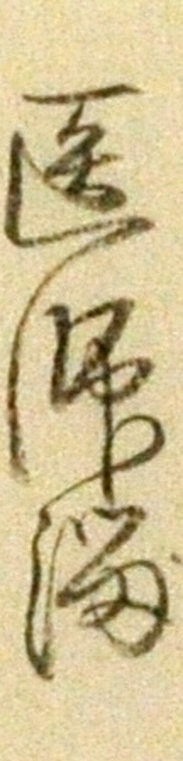医師溜

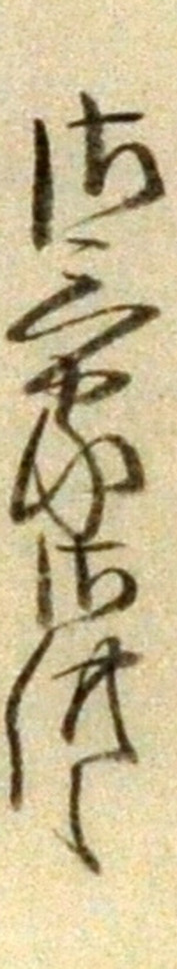御三家御供之
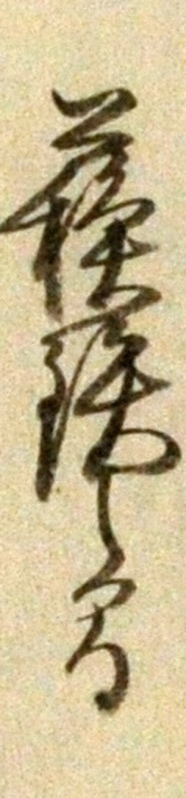蘇鉄之間
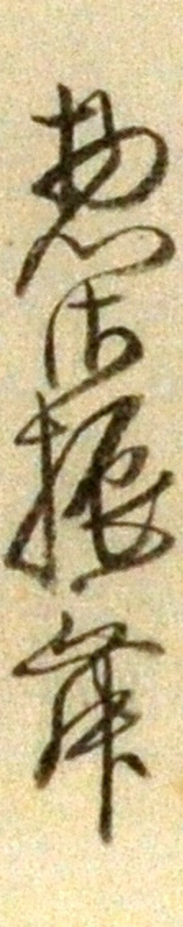惣御振舞
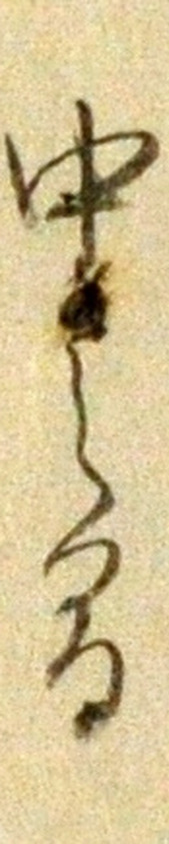中之間
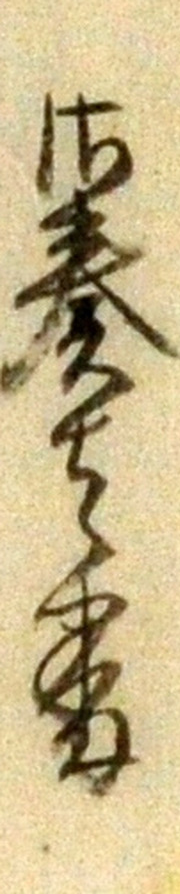御奏者番
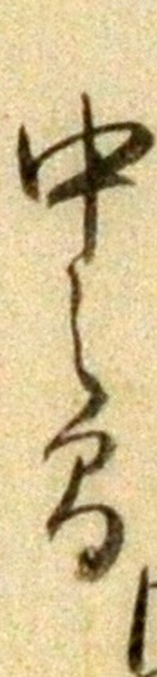中之間
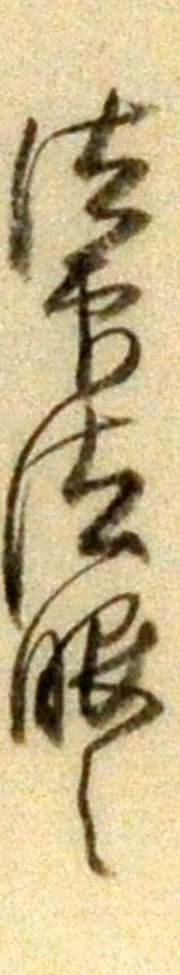法印法眼之
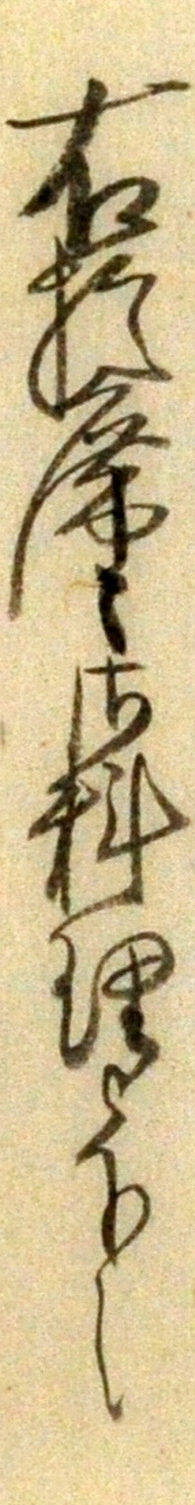右於席々御料理被下之
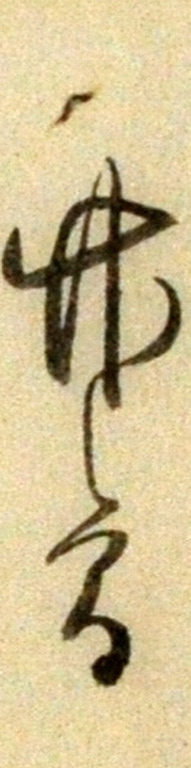竹之間
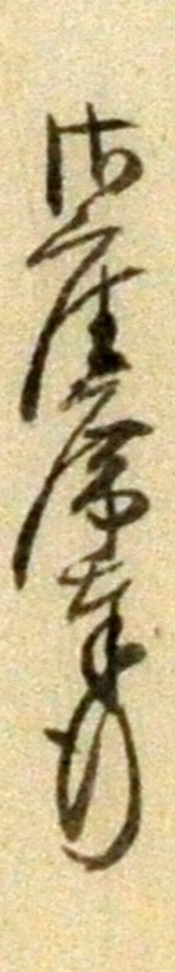御座席奉行
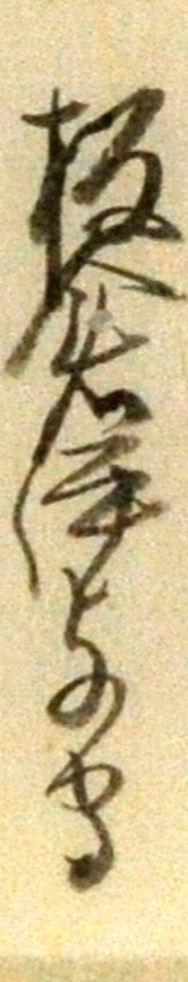板倉伊与守
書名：御馳走御能ノ節ノ留外
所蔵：伊那市立高遠町図書館・合同会社AMANE
